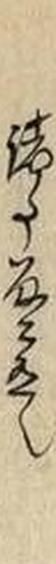諸事留有之
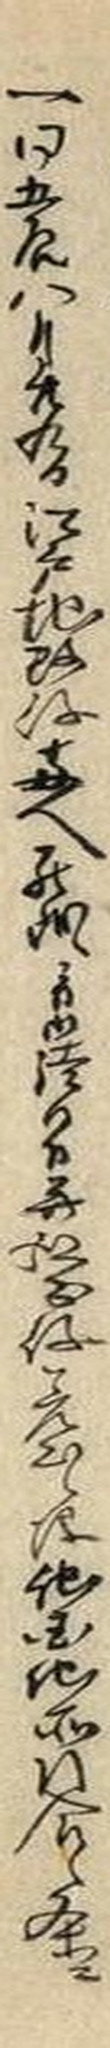一同五辰八月廿九日江戸地改役両人罷越候ニ付御徒目付幷組分役差出候儀他国他所引合之条ニ
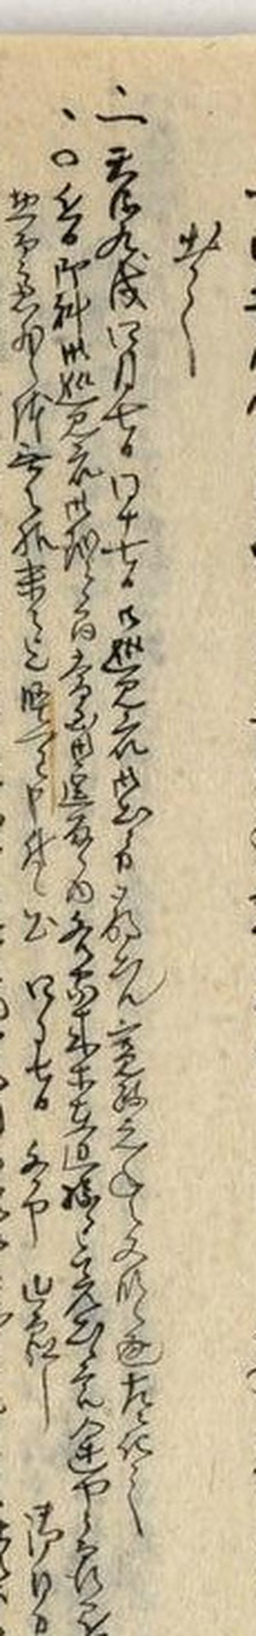・一天保九戌四月七日同十七日御巡見衆御出ニ付御触出ル寛政元年之文段之通左ニ記之
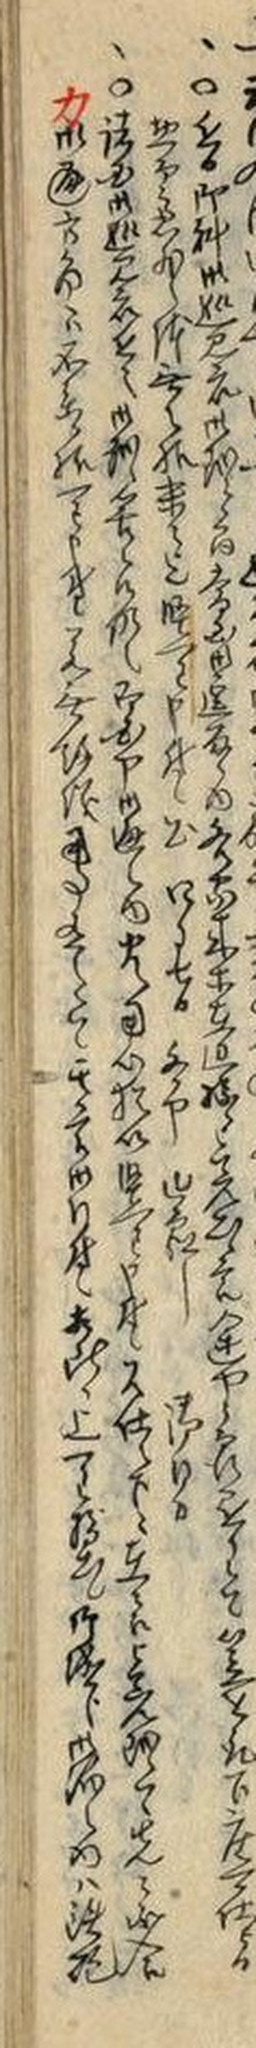・〇諸国御巡見衆近々御越候筈ニ候仍之御国中御通之内火之用心猶以堅可被申付候召仕候下々在々江被差越候ハヽ先々承合
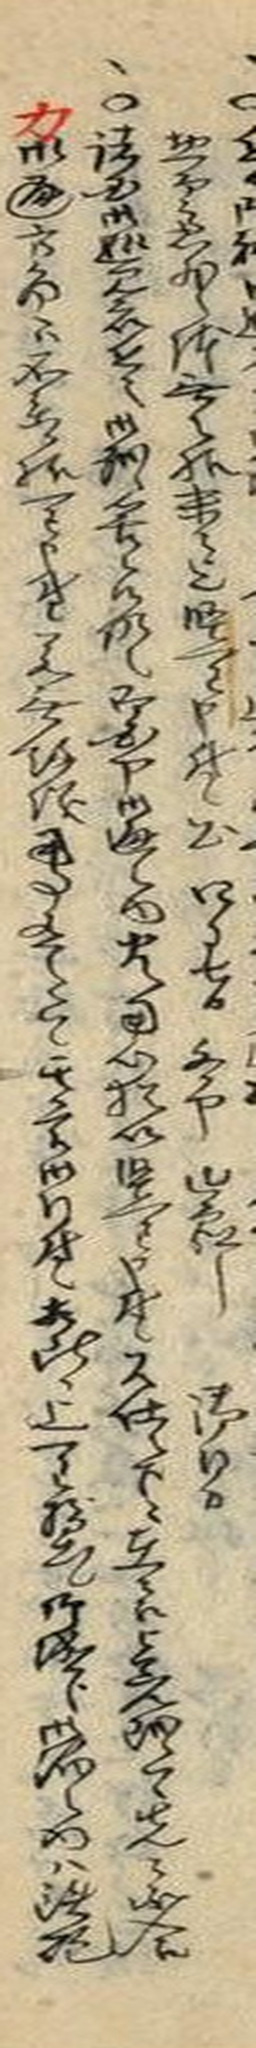御通方角ヘハ不参候様可被申付候若無余儀用事有之候ハヽ其節御目付へ相断候上可被指出候御城下御泊之内ハ鉄炮

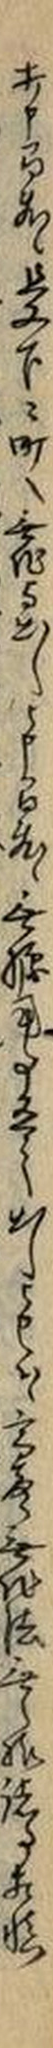打申間敷候且又下々町へ無作与出候被申間敷候無拠用事有之出候被申候ハヽ鳥度之無作法無之様諸事相慎
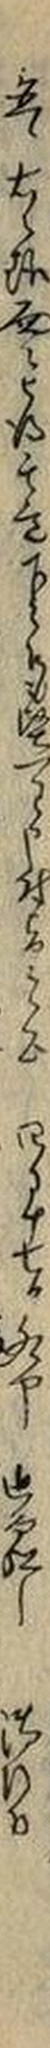置候右之趣面々被得其意下々江も堅可被申付旨ニ候以上四月十七日各中追而組へ御目付
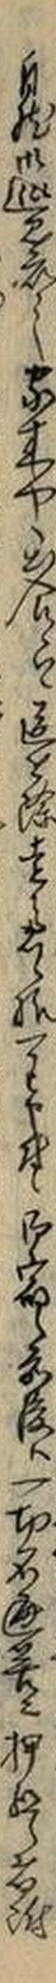自然御巡見衆之家来中へ出合候ハヽ道を除遠慮候様可被申付候御宿之前後ハ一切不通筈ニ押組之者附
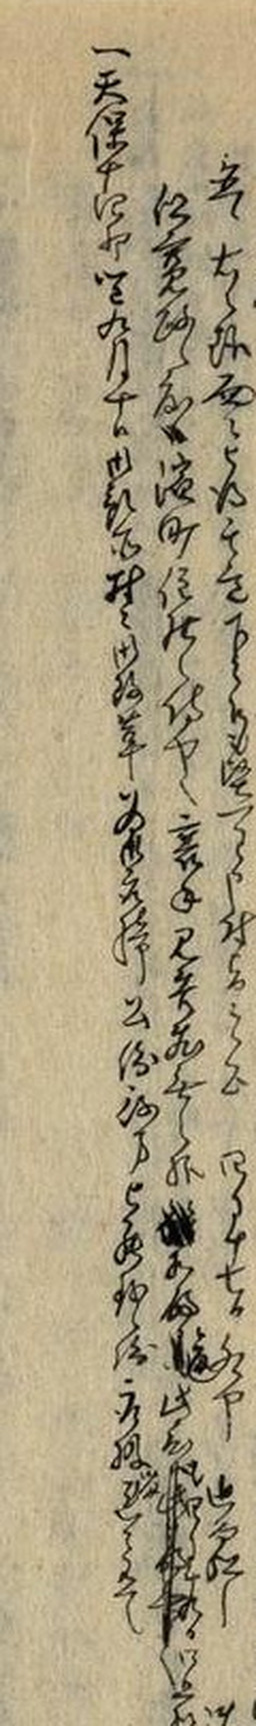一天保十四卯閏九月十日御預所村々御改革為御取締公儀役方被罷越候儀取扱留連々有之

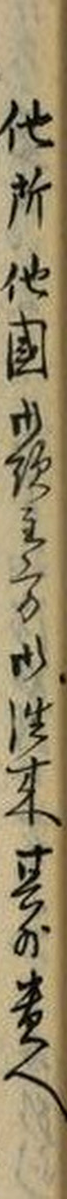他所他国御領主方御往来其外貴人
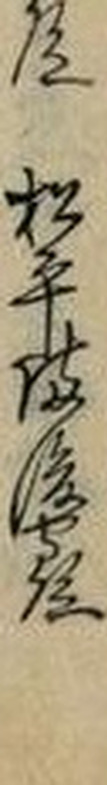松平出雲守殿
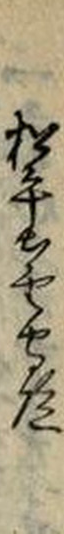松平出雲守殿
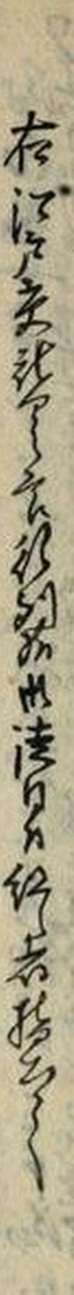右江戸交替之節行列附御徒目付組之者指出之
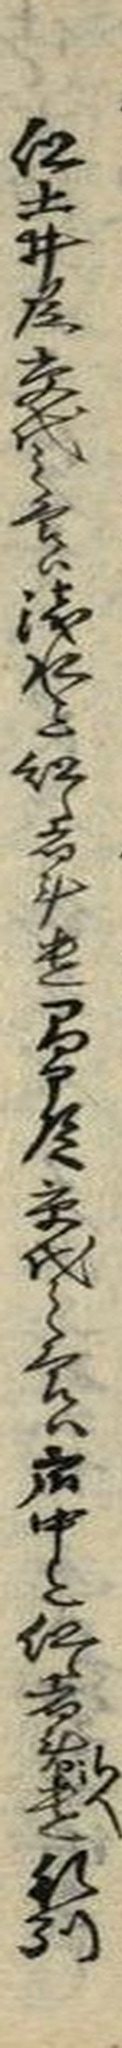但土井殿交代之節ハ浅水迄組之者斗遣間部殿交代之節ハ府中迄組之者弐人遣行列
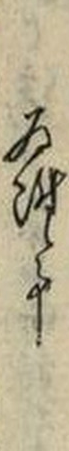為附候事
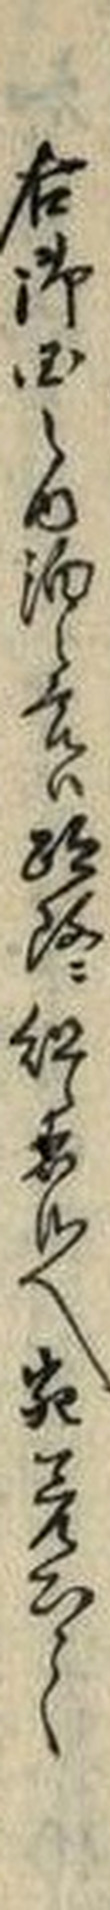右御国之内泊之節ハ跡改ニ組之者弐人宛差出之
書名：御国他国諸事之部
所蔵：福井県文書館 Fukui Prefectural Archives
